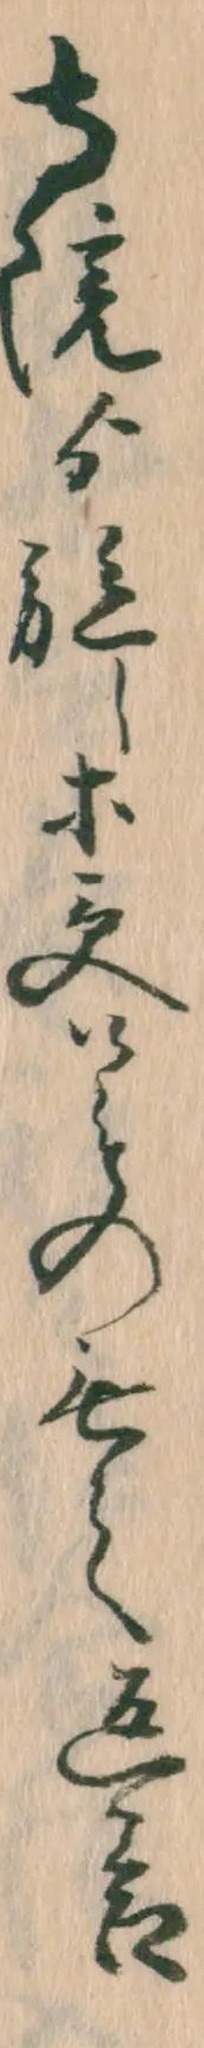寺院ゟ施し等受候もの無之返答

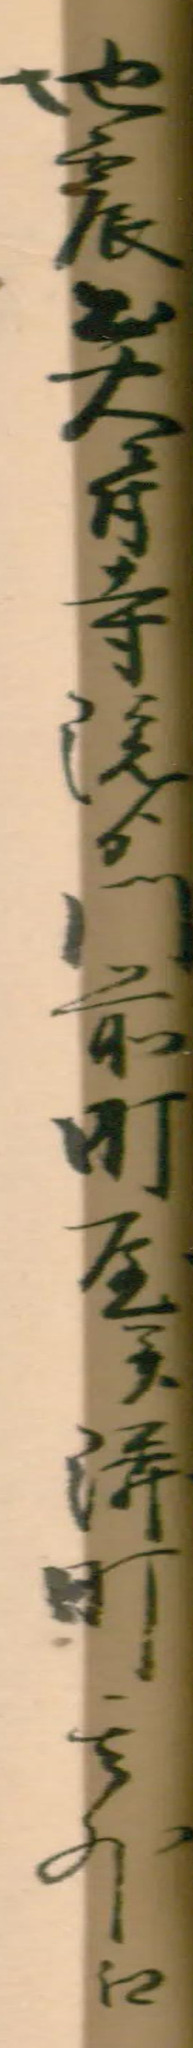一地震出火ニ付寺院ゟ門前町屋并隣町其外え
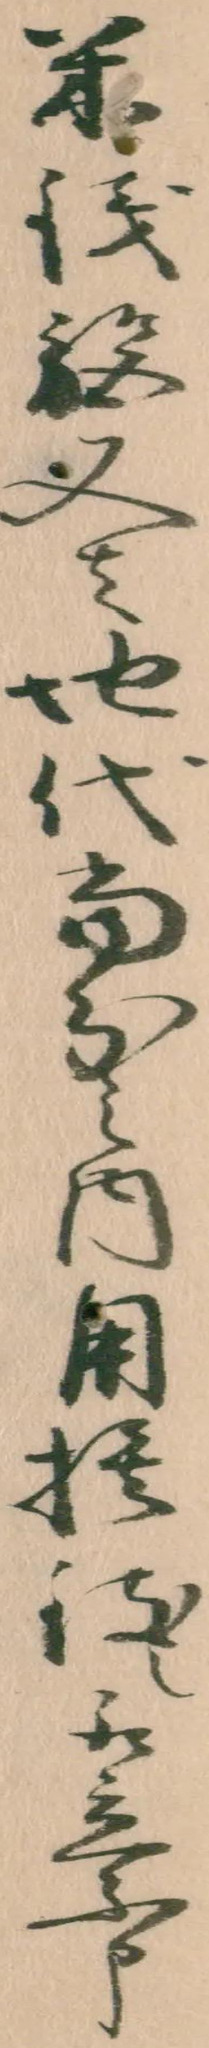米銭施又は地代当分之内用捨致シ取立不申
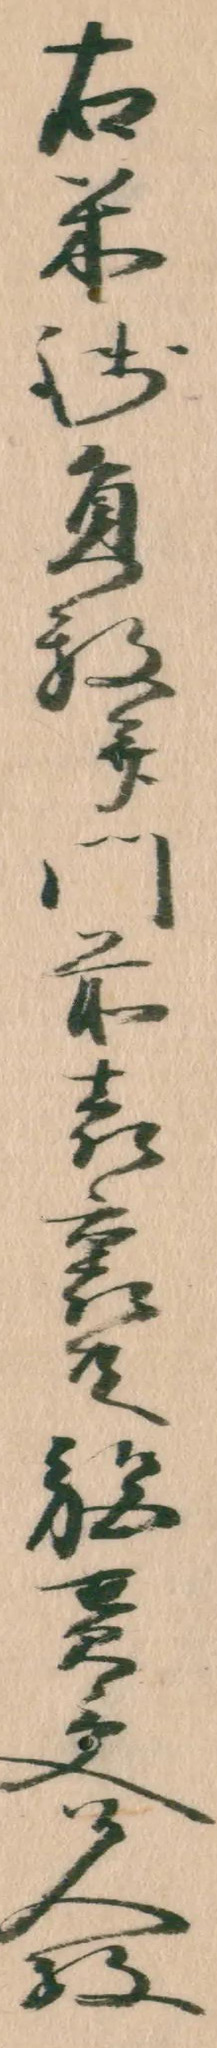右米銭員数并門前表裏共施貰受候人数
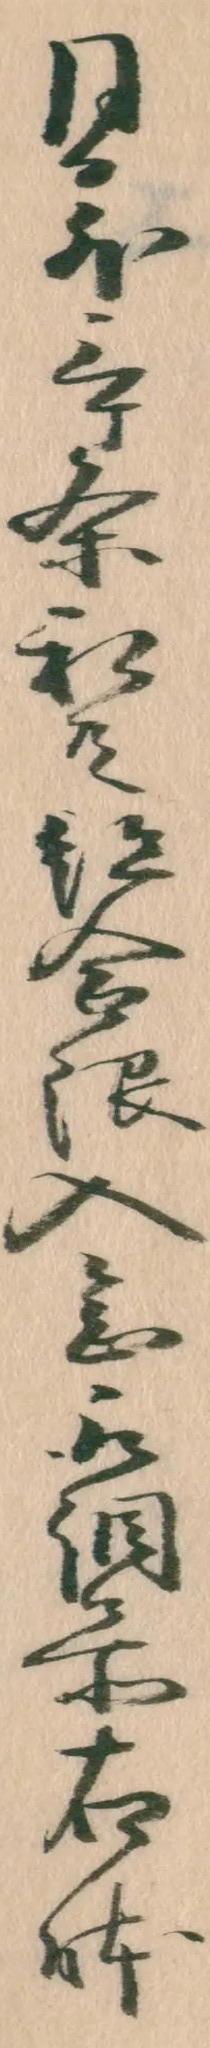月日外三ケ条私共組合限入念取調候所右体
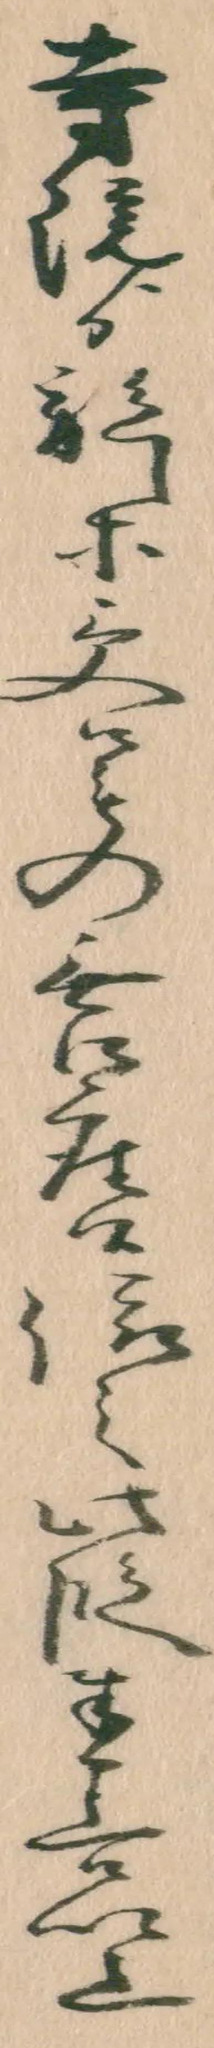寺院ゟ施し等受候もの無御座候依之奉申上候以上
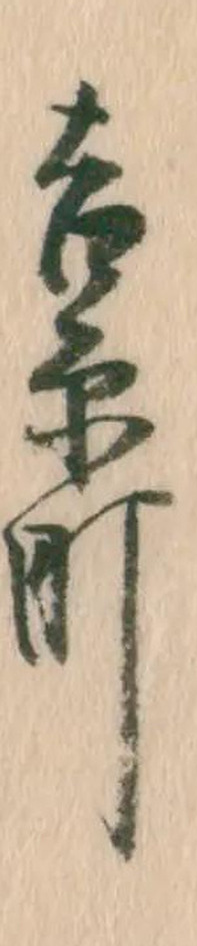吉原町
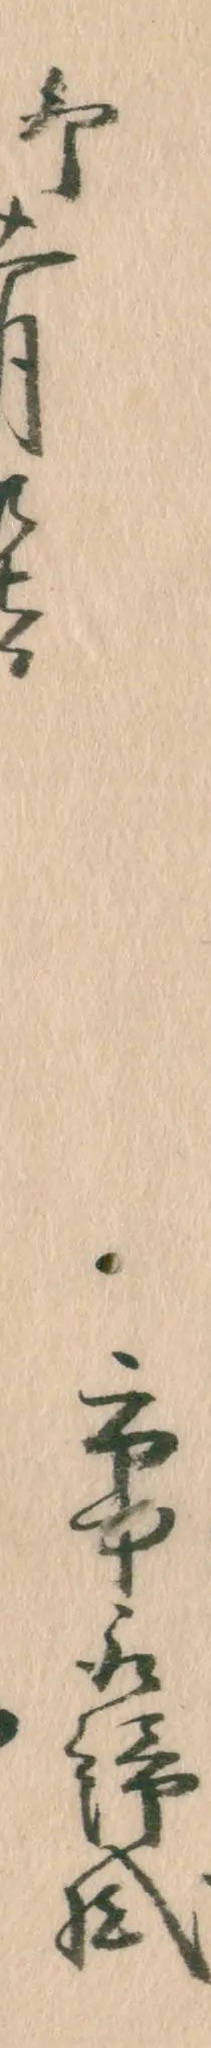卯十一月廿七日市中取締掛
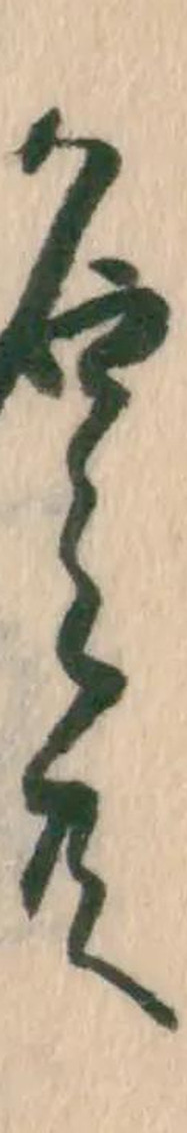名主共

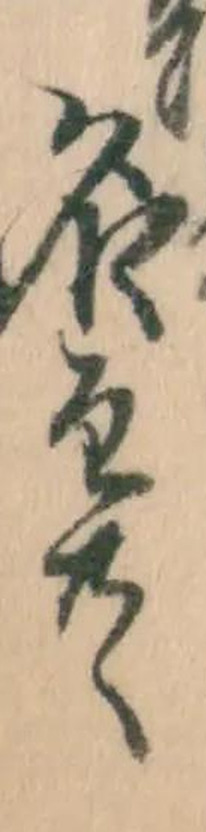名主共

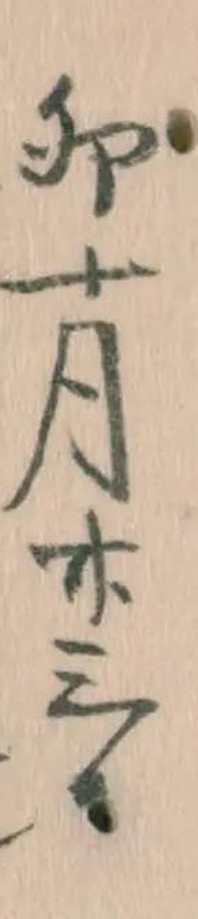卯十月廿三日
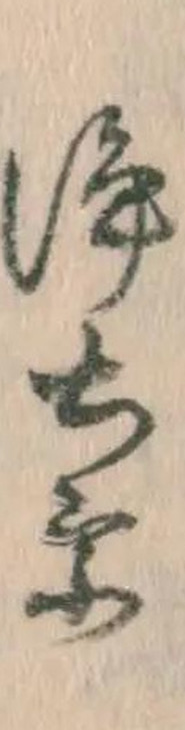浄土宗
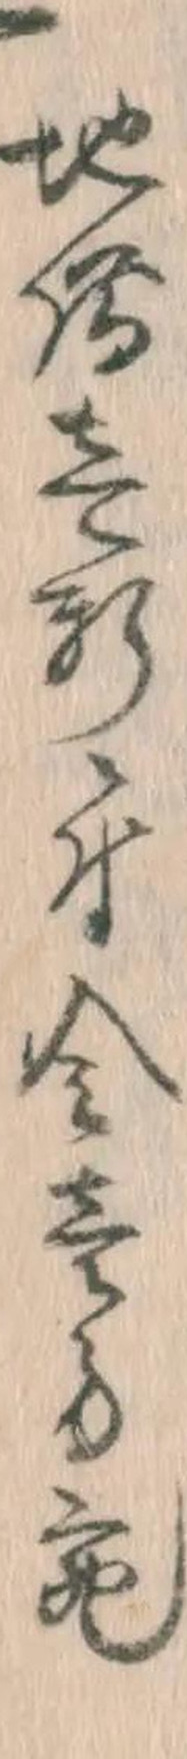地借壱軒に付金壱分宛
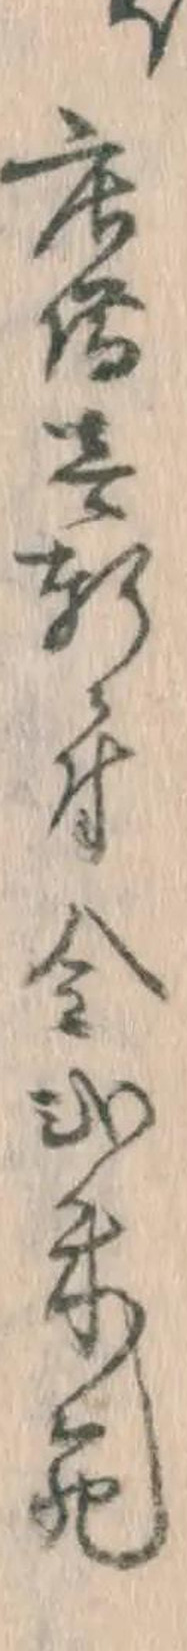地借壱軒に付金壱分宛
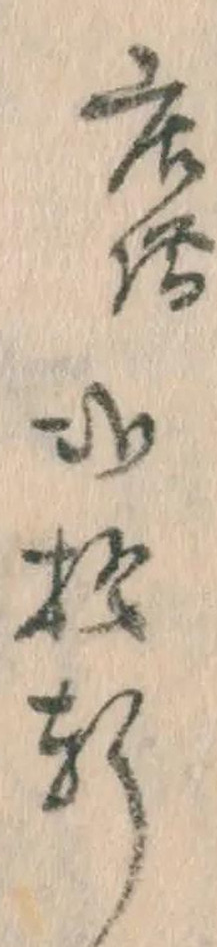店借弐拾軒
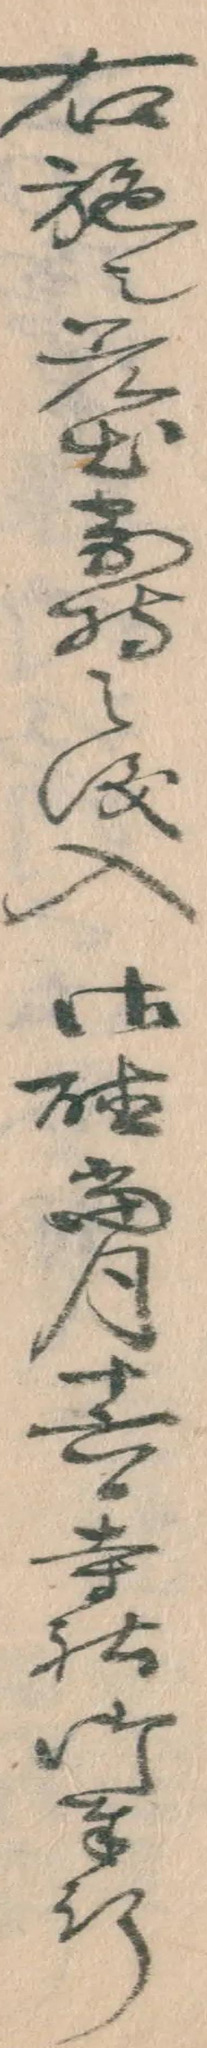右施し差出寄持之儀入御聴当月十六日寺社町奉行
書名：武家方并寺院等ニテ施差出候一件
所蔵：国立国会図書館 National Diet Library, JAPAN
